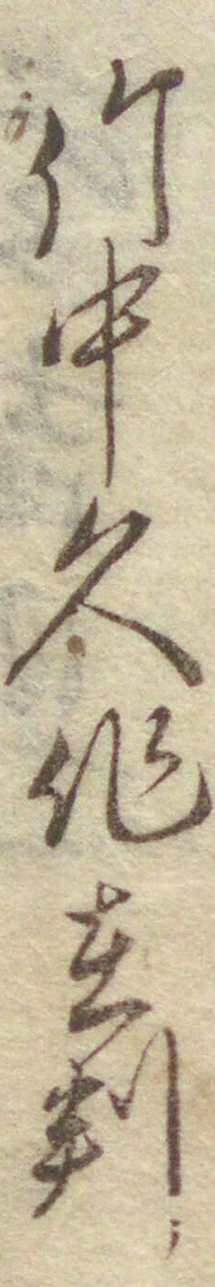竹中久作在判

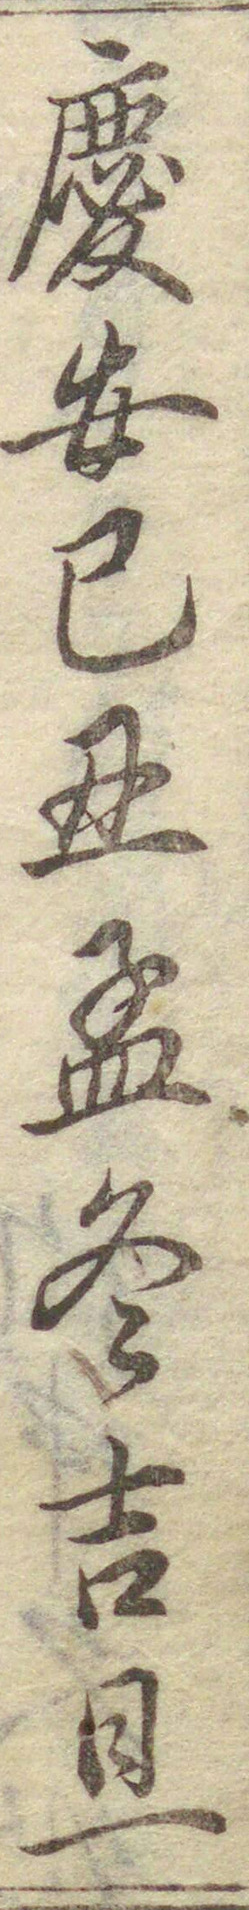慶安己丑孟冬吉旦
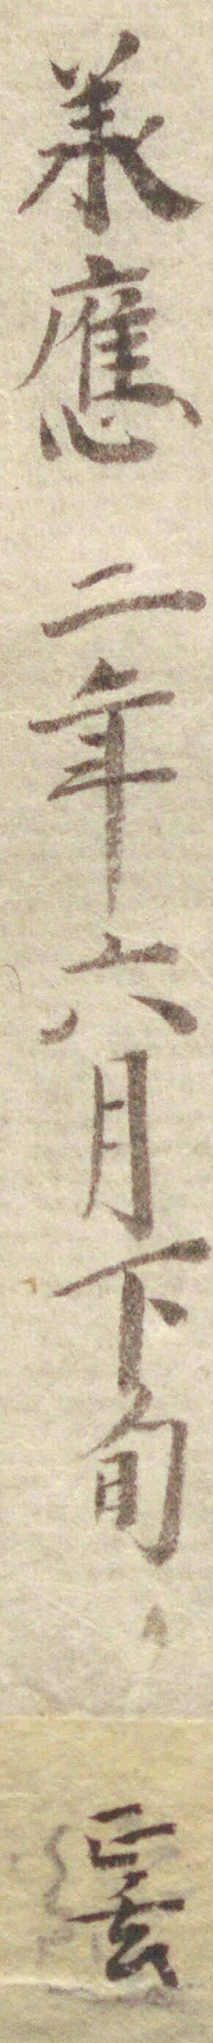承応二年六月下旬正玄
